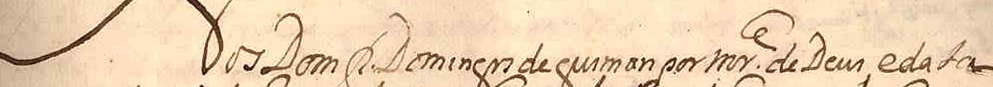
Nos Dom fr. Domingos de gusman por mr.ce de Deus, e da sa
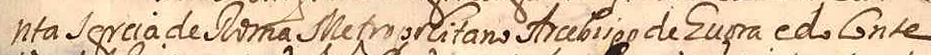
nta Igreia de Roma Metropolitano Arcebispo de Euora, e do Conse
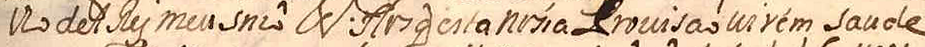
lho del Rej meu snrō &. Aos q̄ esta nossa Prouisaõ uirem, saude
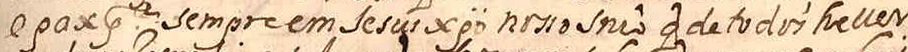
e pax p.a sempre em Iesus xpō nosso snrō q̄ de todos he uer
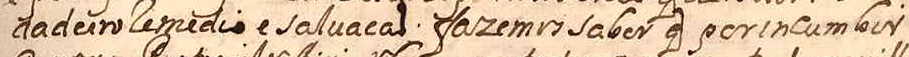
dadeiro Remedio e saluaçaõ. fazemos saber q̄ por incumbir
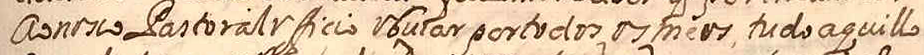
ao nosso Pastoral officio obuiar por todos os meos, tudo aquillo
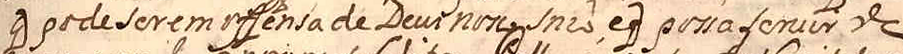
q̄ pode ser em offensa de Deus nosso snrō, e q̄ possa seruir de
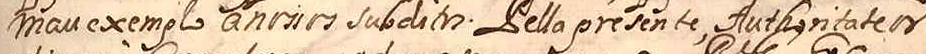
mau exemplo a nossos subditos. Pella presente, Authotitate or
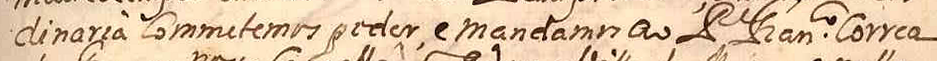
dinaria Commetemos poder, e mandamos ao P.e Fran.co Correa
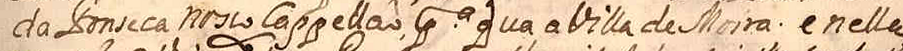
da Fonseca nosso Cappellaõ, p.a q̄ ua a Villa de Moira; e nella
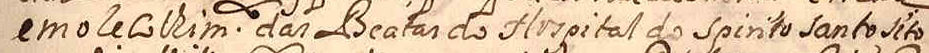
em o Recolhim.to das Beatas do Hospital do Spirito Santo sito
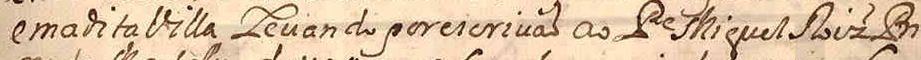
em a dita Villa Leuando por escriuaõ ao P.e Miguel Roiz̄ Pri
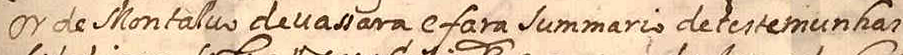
or de Montaluo deuassara e fara summario de testemunhas
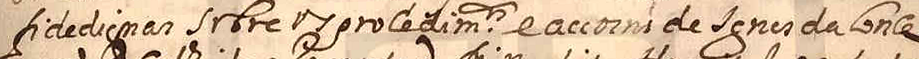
fidedignas sobre os procedim.tos, e acçoins de Ignes da Conce
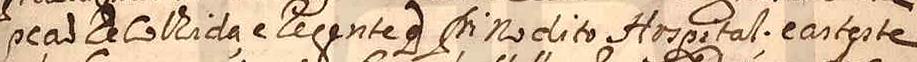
pçaõ Recolhida, e Regente q̄ foi no dito Hospital; e as teste
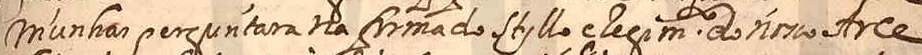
munhas perguntara na forma do Styllo, e Regim.to do nosso Arce
